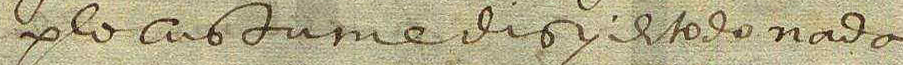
plo custume disy de todo nada
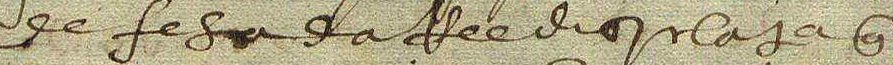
defesa da Ree disj ela ta q̄
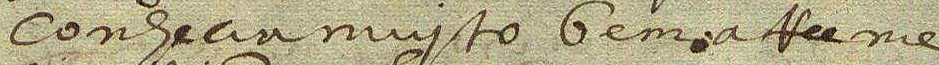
conhecia mujto bem a Ree me
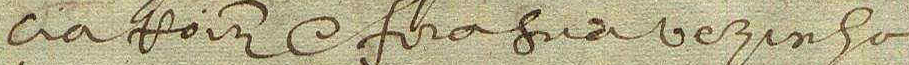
çia Roiz̄ e fora sua vezinha
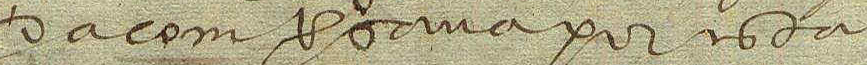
e a comꝟsaua por estar
